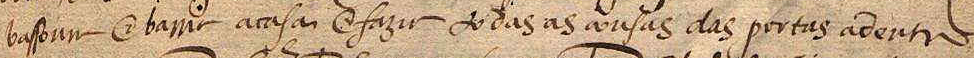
vassoura e varria a casa e fazia todas as cousas das portas adentro
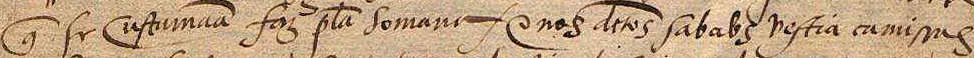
q̄ se Custumā a faz̄ p̄la somana / e nos d̄ctos sabados vestia camissas
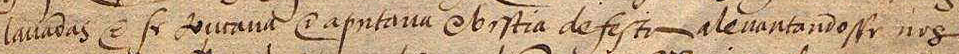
lauadas e se toucaua e apertaua e vestia de festa aleuantandosse nos
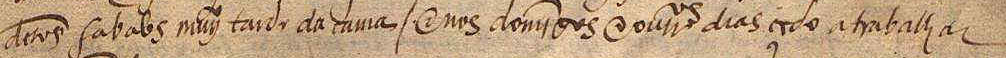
d̄ctos sabados muyto tarde da cama /. e nos dom̄jgos e outros dias çedo a trabalhar
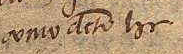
como d̄cto he
